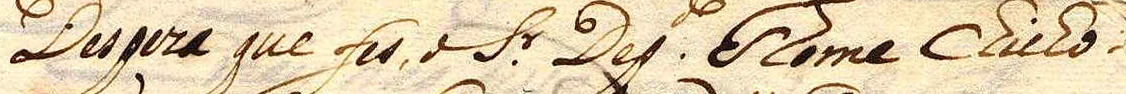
Despeza que fes, o S.r Dep.do Thome chicho
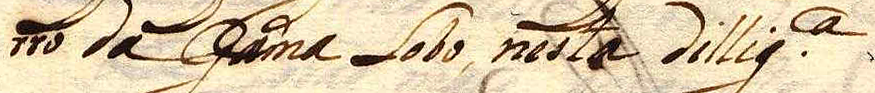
rro da Gama Lobo, nesta dillig.ca
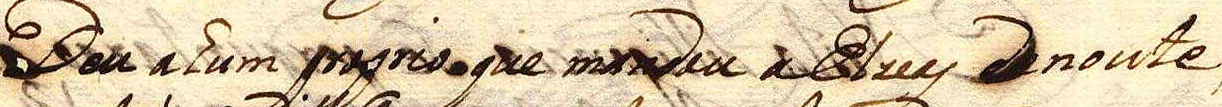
Deu a hum proprio que mandou a Elvas de noute,
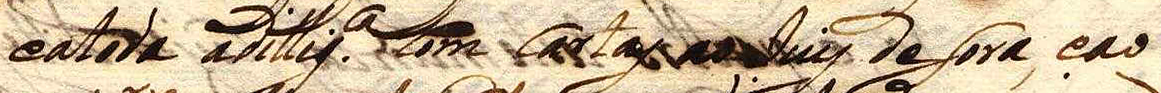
e a toda a dillig.ca com cartas ao Iuis de fora, e ao
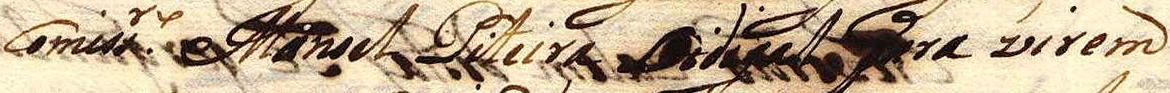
comiss.ro Manoel Piteira Vidigal para virem
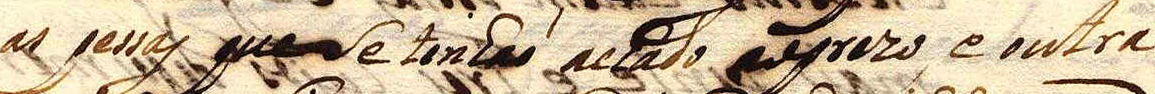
as pessas que se tinhaõ achado ao prezo, e outra
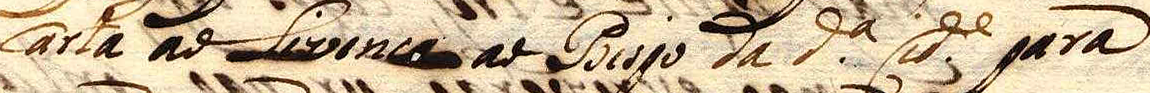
carta a oLivença ao Bispo da d.a Cid.e para
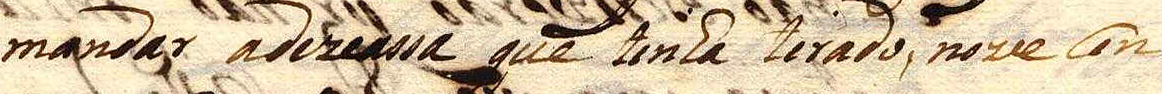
mandar a devassa que tinha tirado, nove con
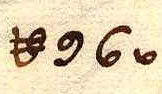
$960
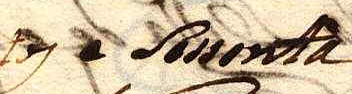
tos e sessenta
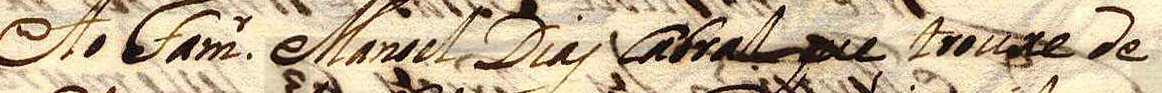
Ao Fam.r Manoel Dias Cabral que trouxe de
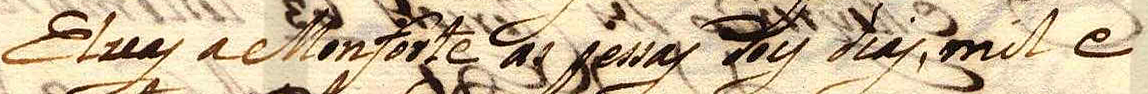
Elvas a Monforte as pessas dois dias, mil e
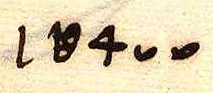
1$400
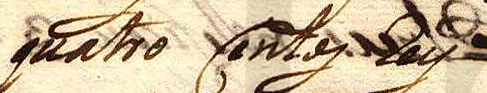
quatroCentos Reis
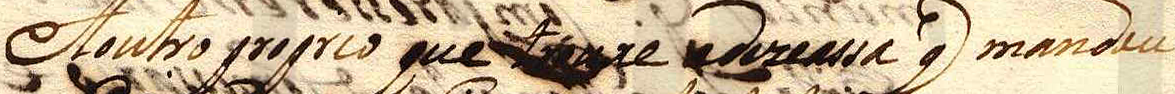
A outro proprio que trouxe a devassa q̄ mandou
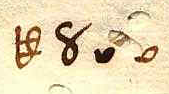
$800
